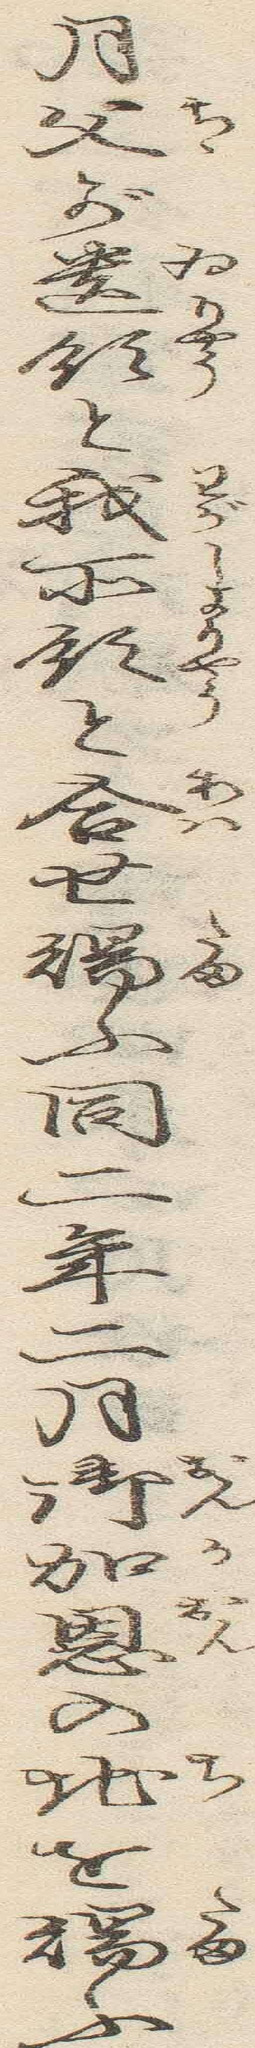月父が遺領と我所領と合せ賜ふ同二年二月御加恩の地を賜ふ
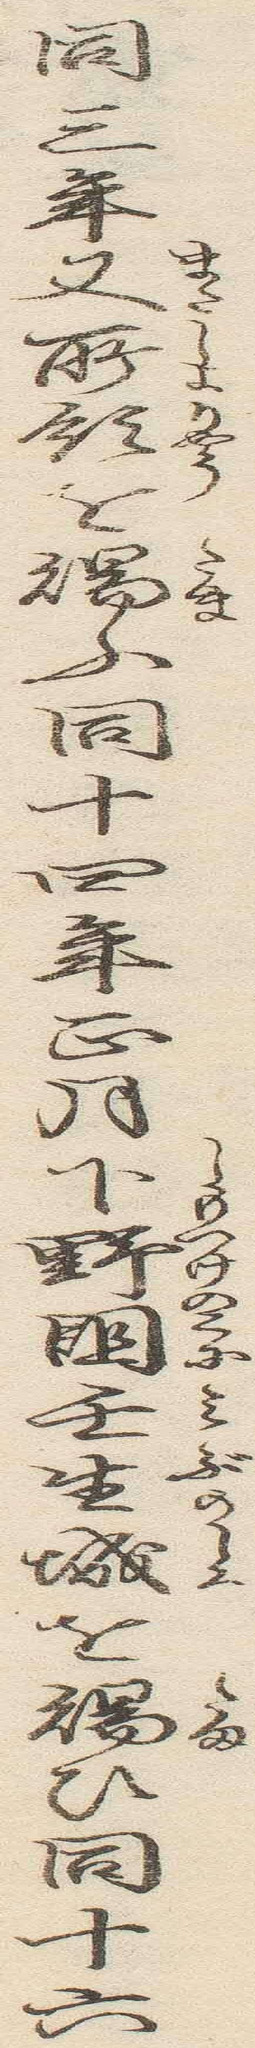同三年又所領を賜ふ同十四年正月下野國壬生城を賜ひ同十六
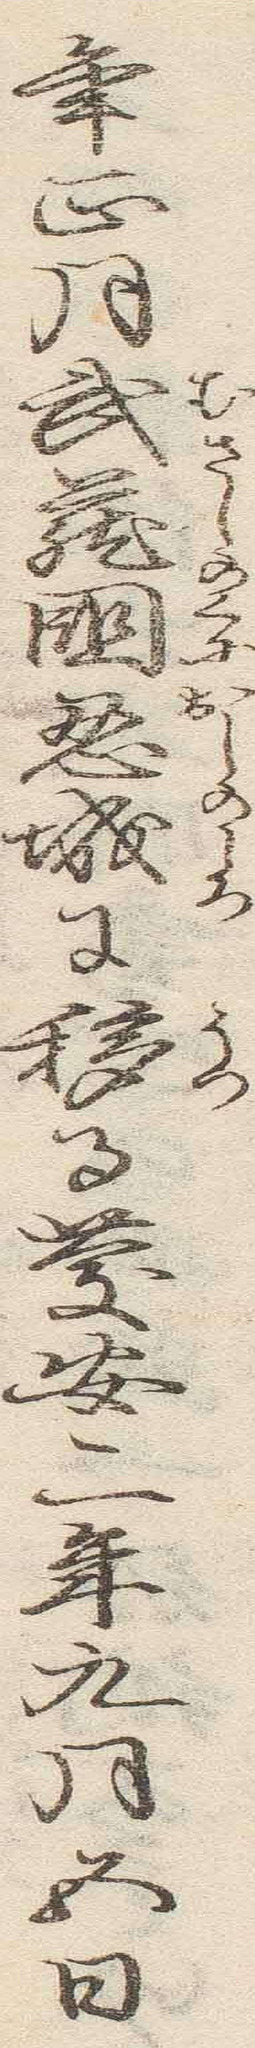年正月武蔵國悪城に移る慶安二年九月五日
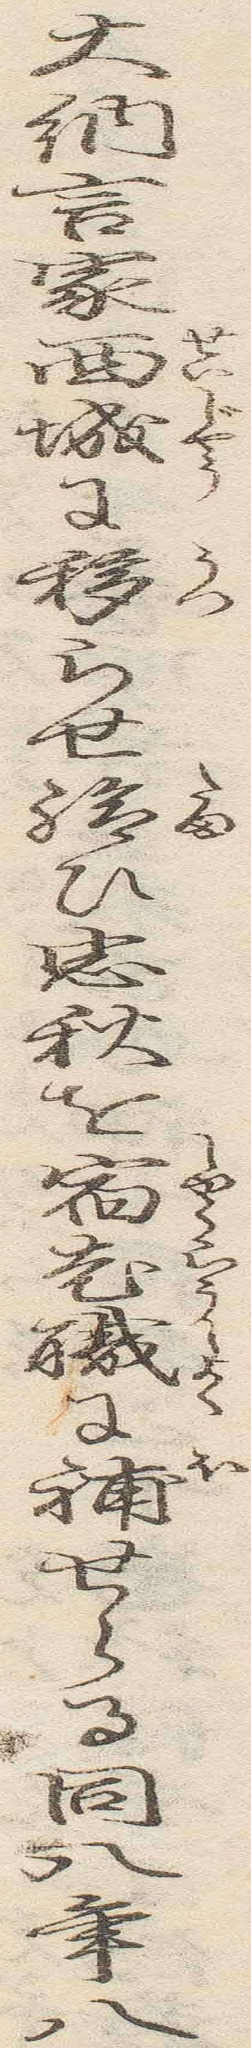大納言家西城に移らせ給ひ忠秋を宿老職に補せらる同八年八
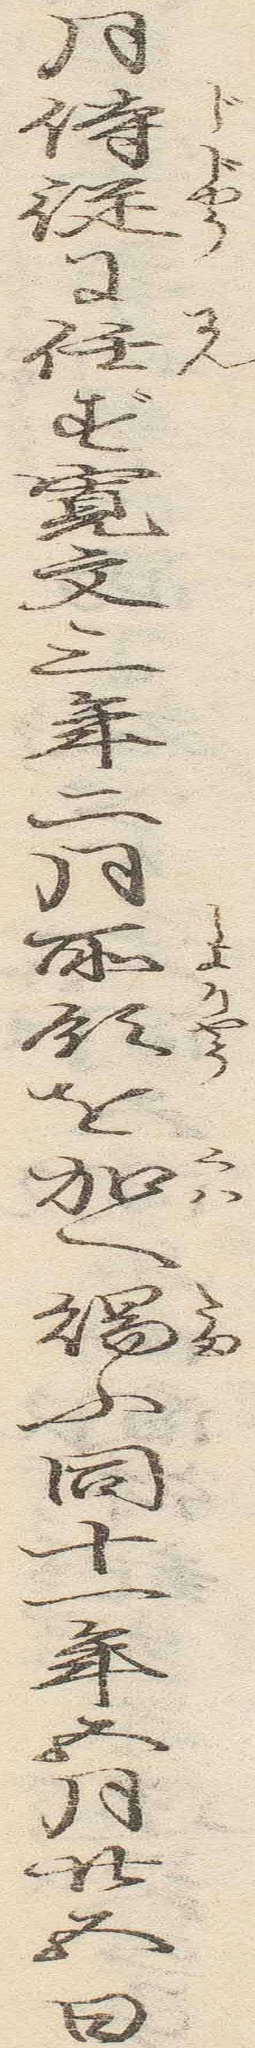月侍従に任ず寬文三年二月所領を加へ賜ふ同十一年五月廿五日
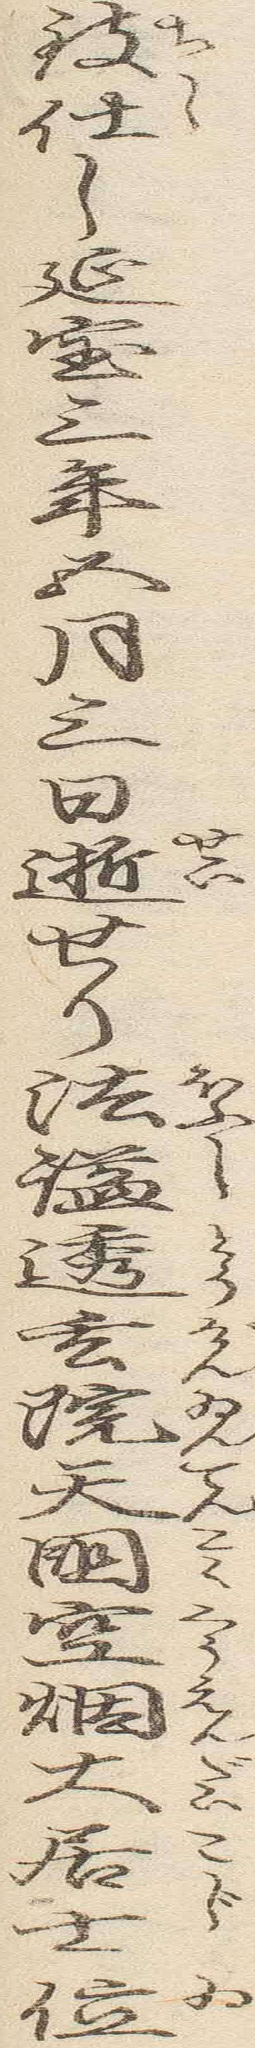致仕し延宝三年五月三日逝せり法諡透玄院天國空烟大居士位
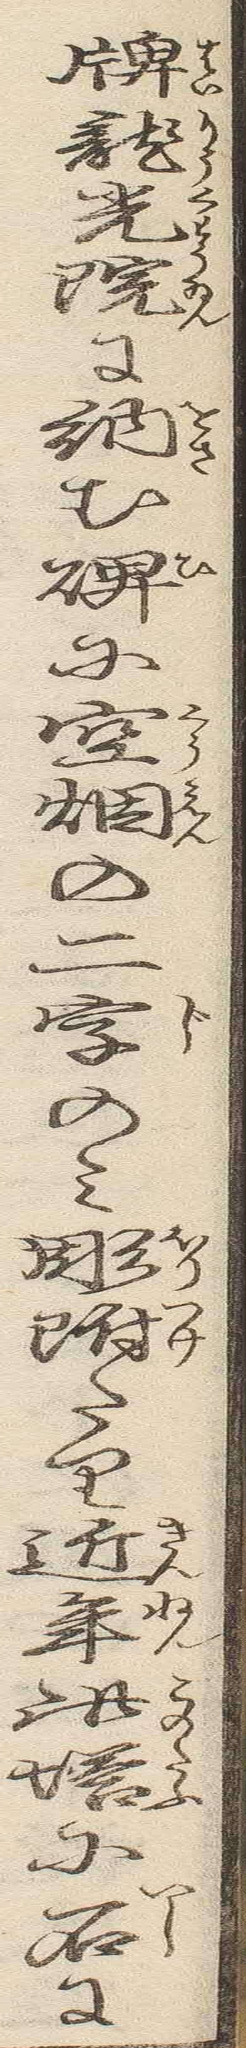牌龍光院に納む碑に空烟の二字のみ彫附たり近年此塔に石に
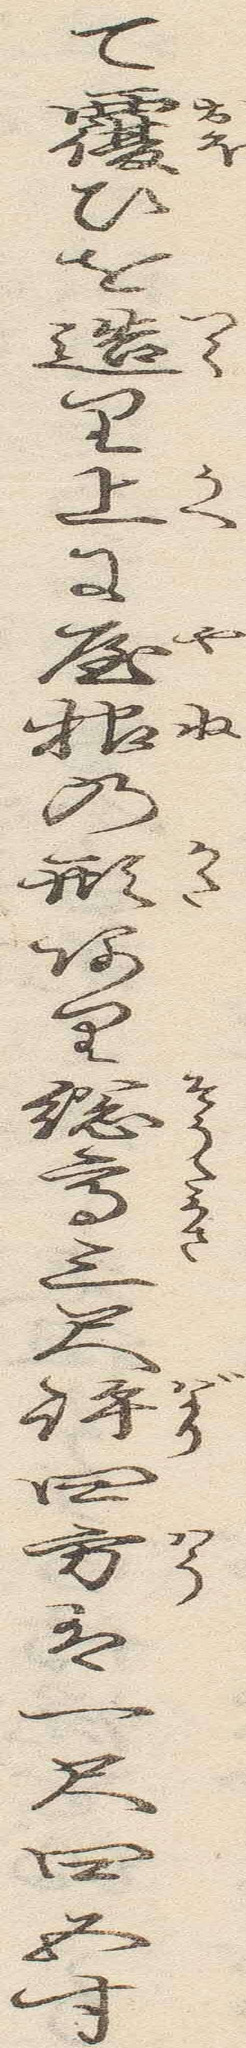て覆ひを造り上に屋根の形あり総高三尺許四方は一尺四五寸
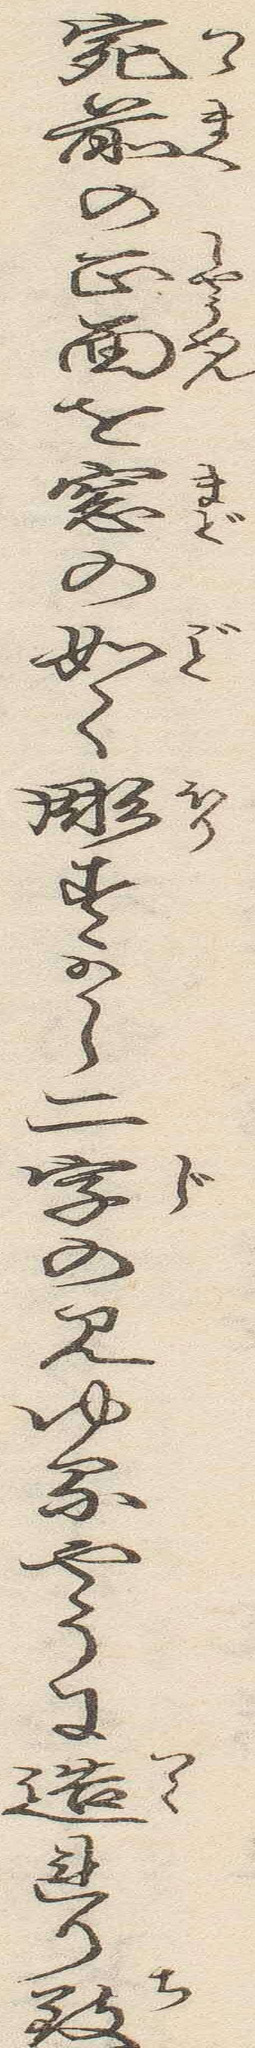宛前の正面を窓の如く彫すかし二字の見ゆるやうに造れり致
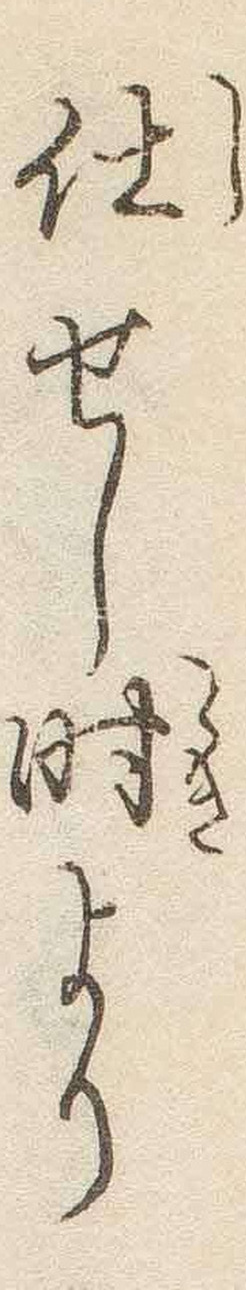仕せし时より
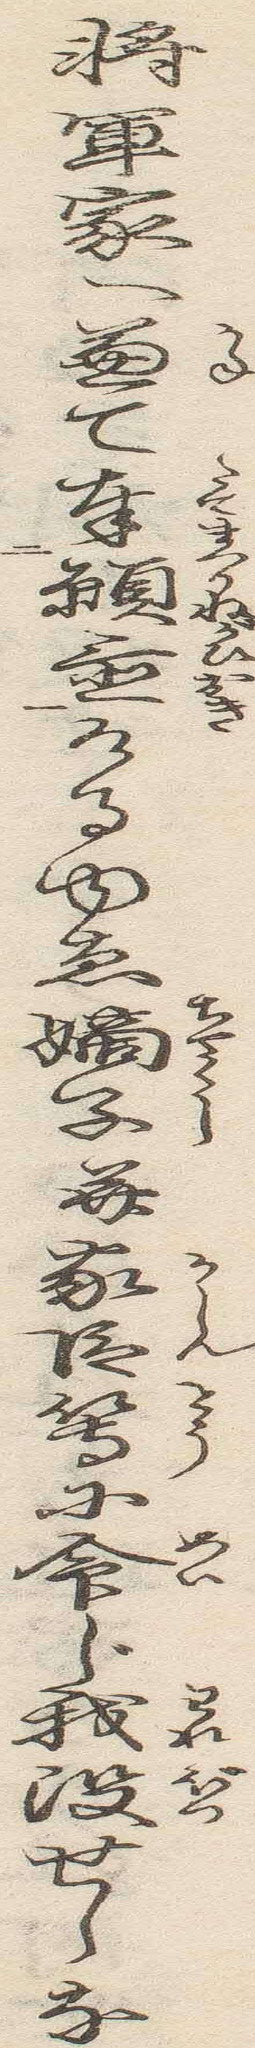將軍家へ兼て奉願置けるゆゑ嫡子并家臣等に命じ我没せしな
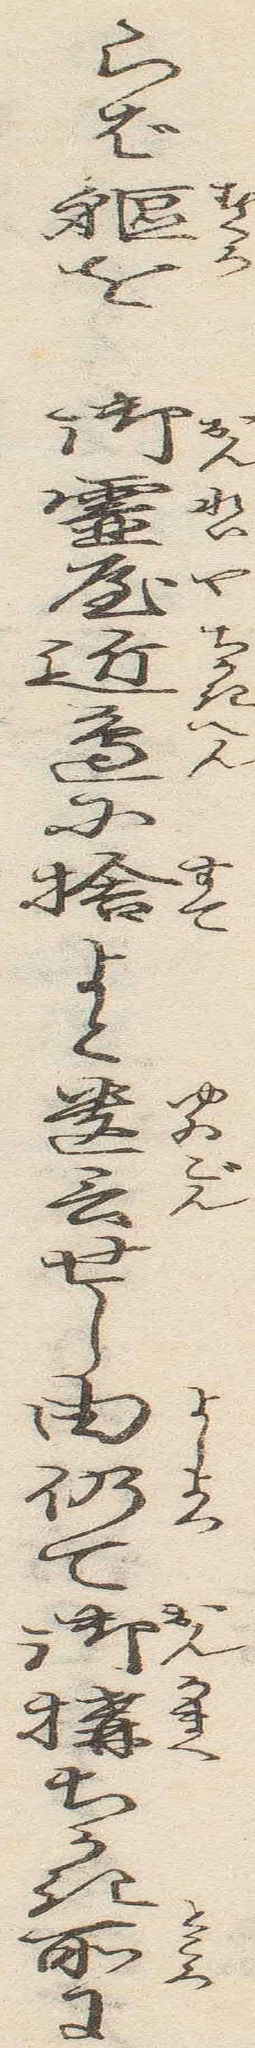らば軀を御靈屋近邊に捨よと遺言せし由仍て御構ちかき所に
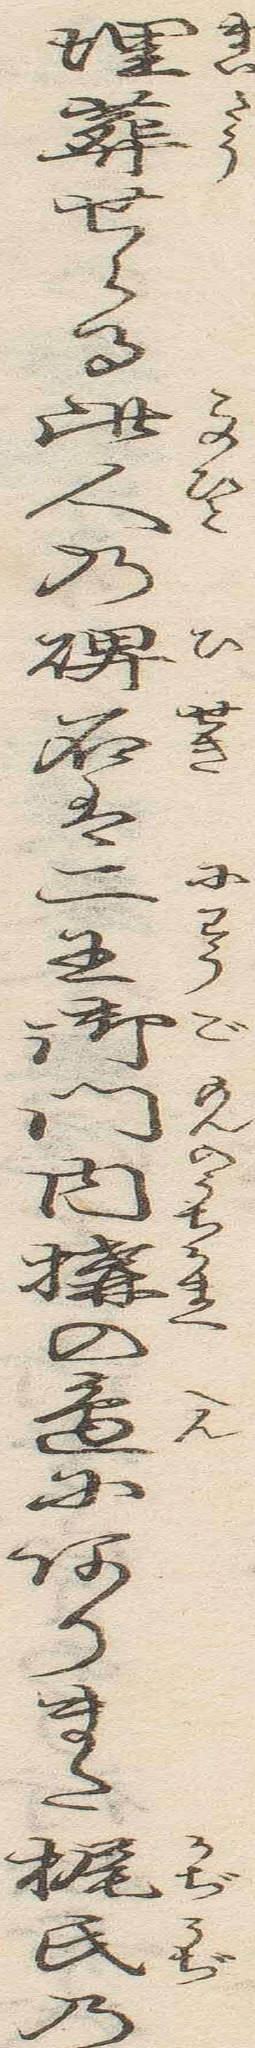埋葬せらる此人の碑石は二王御門内構の邊にありまた梶氏の
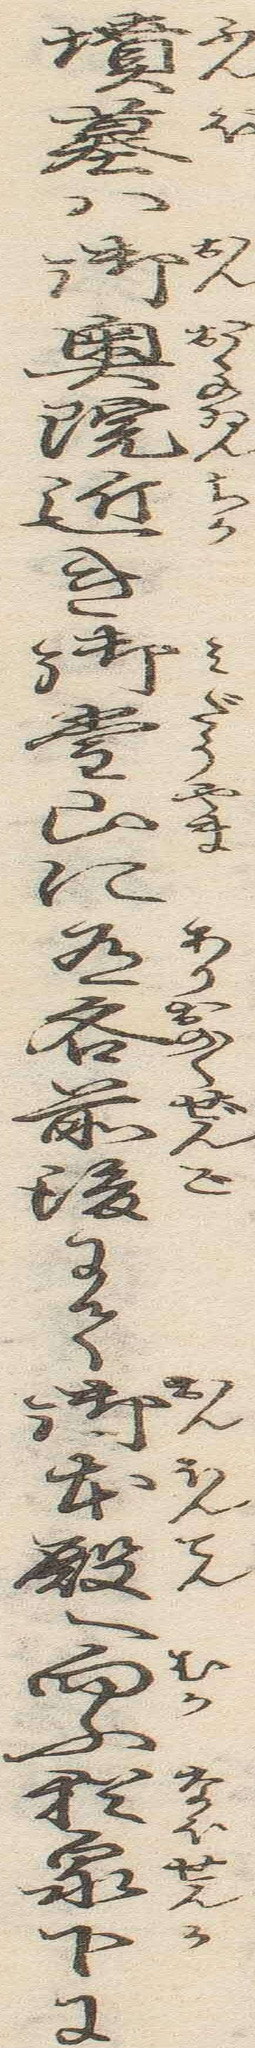墳墓は御奥院近き御堂山に有各前後にて御本殿へ向ふ猶泉下に
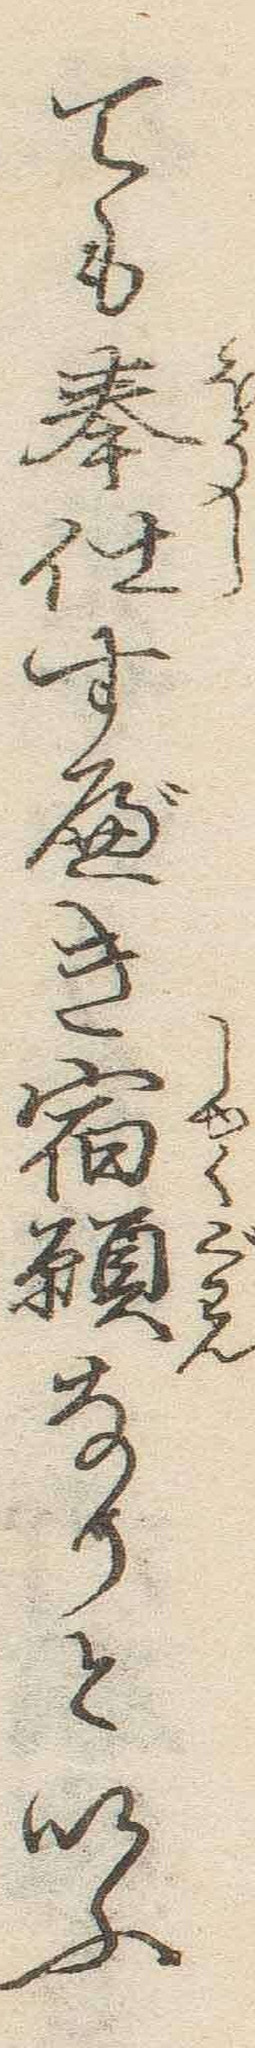ても奉仕すべき宿願なりといふ
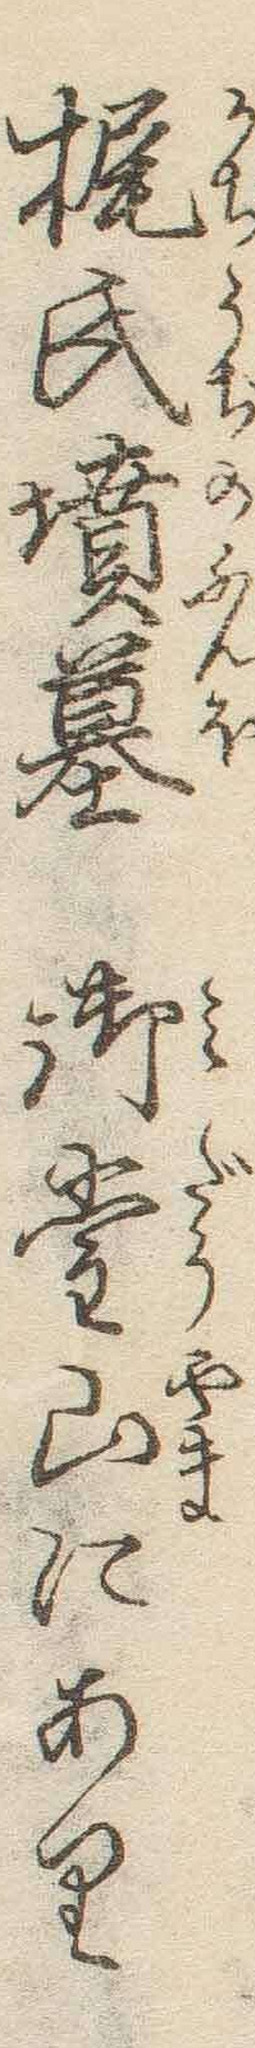梶氏墳墓御堂山にあり
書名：日光山志
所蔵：東京学芸大学附属図書館 国文学研究資料館
